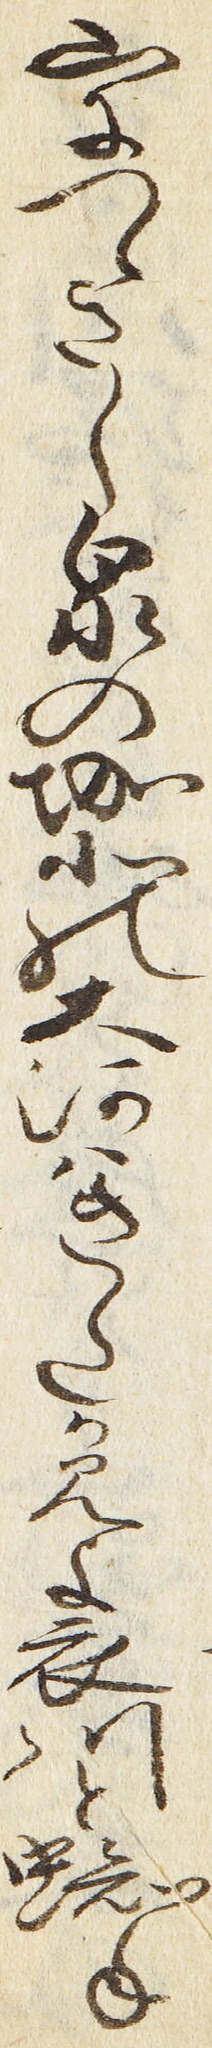山につゝきし泉の城北の大河はきたかみよ衣川と蜘手
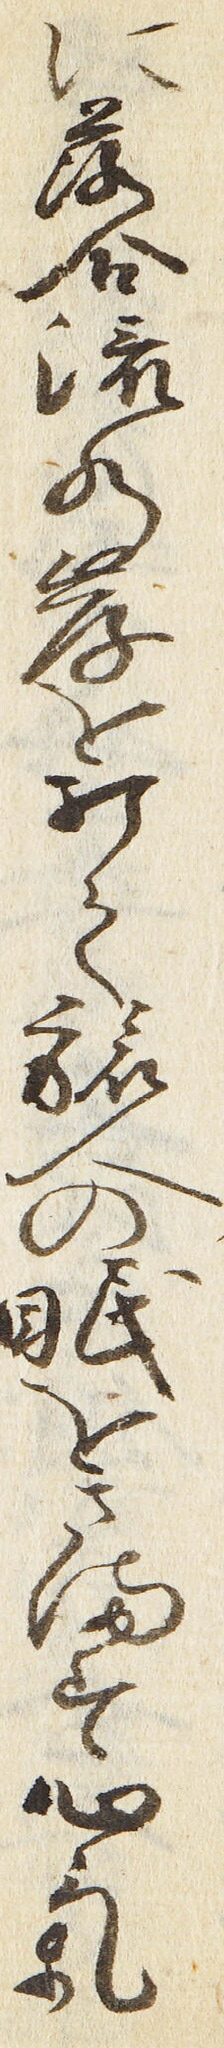に落合流水岸を打て旅人の眠をさます心気
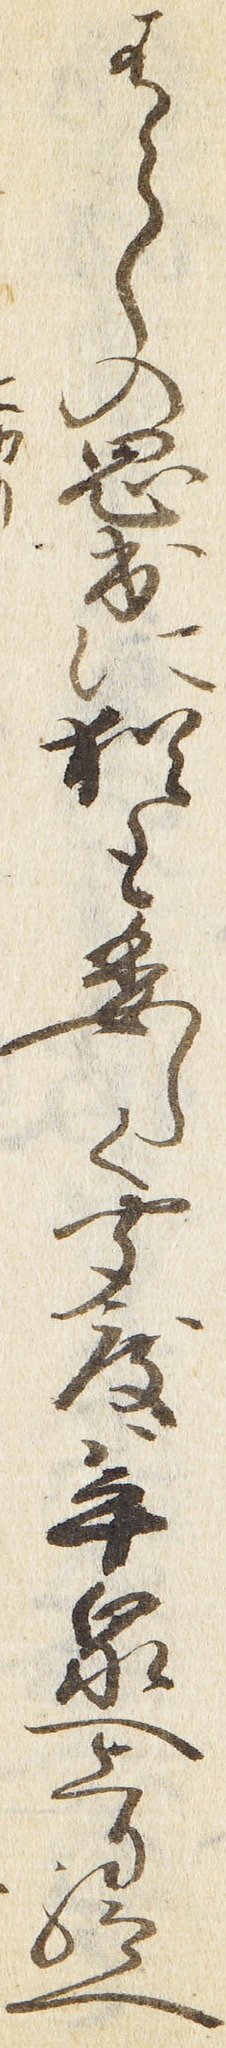はらしの思出に猶も委しく聞度は平泉へ上り給へ
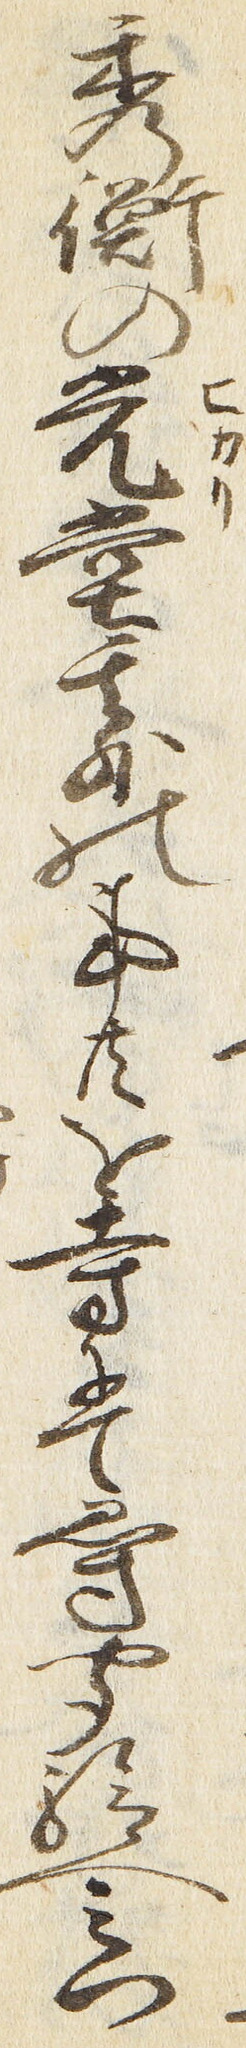秀衡の光堂其外の事共を寺にて尋聞給へみつ
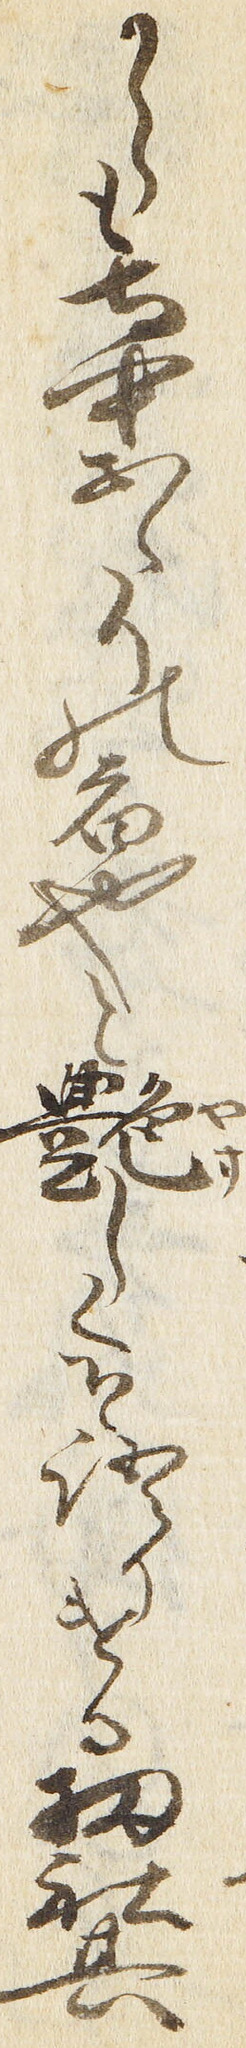からも寺中あたりの者也と艶しくそ語りける扨社其
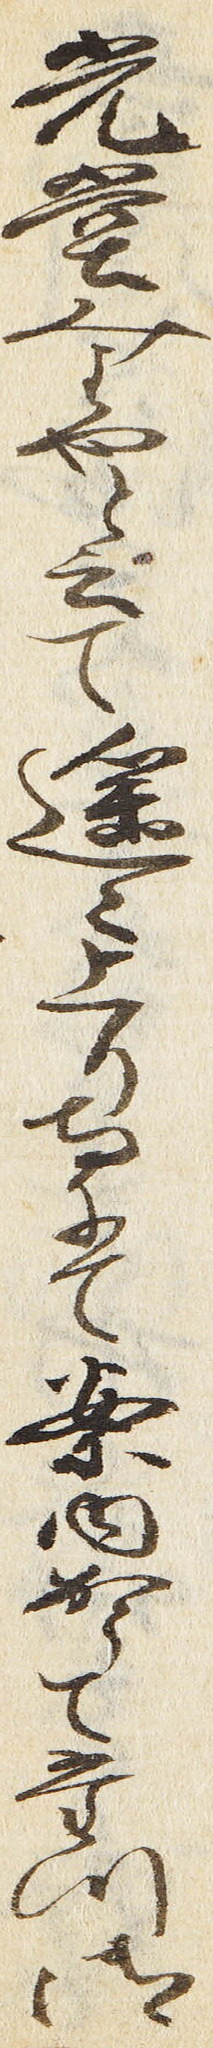光堂みはやと云て遥々上り寺にて案内かうてたつ御
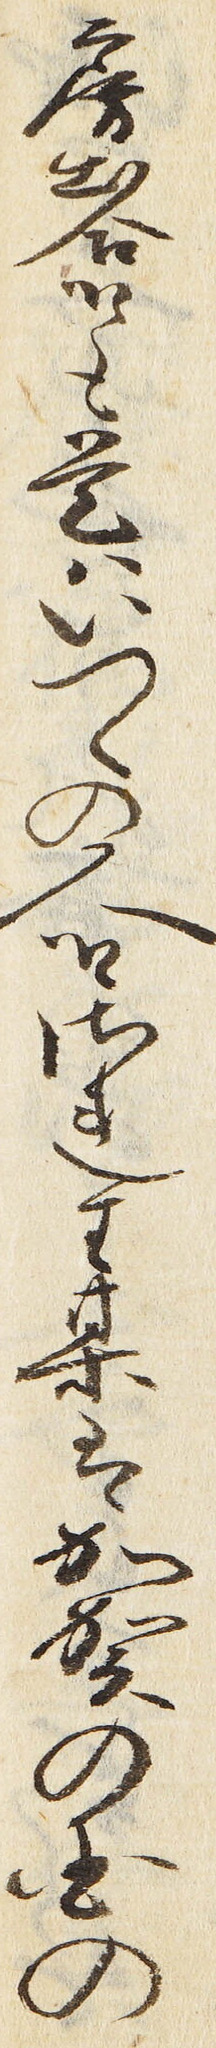房出合そも是ハいつくの人そされは某は加賀の国の
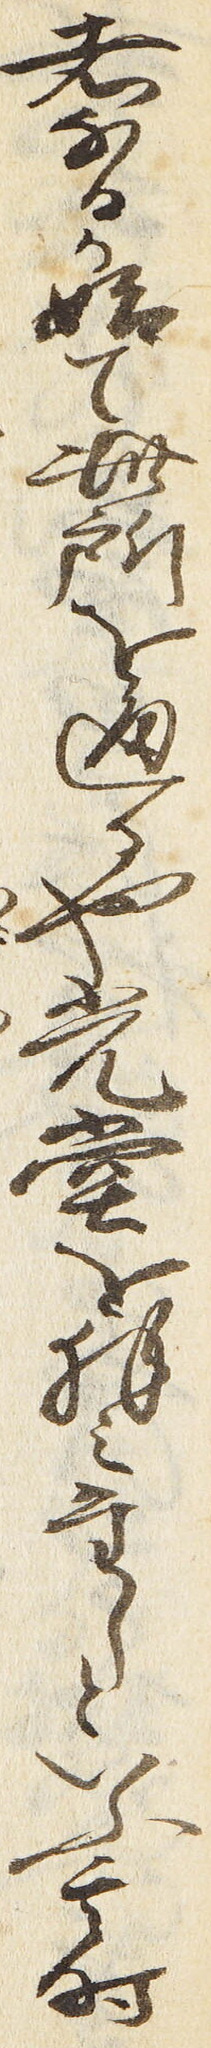者なるか始て此所を通る也光堂を拝みたしといふ其時
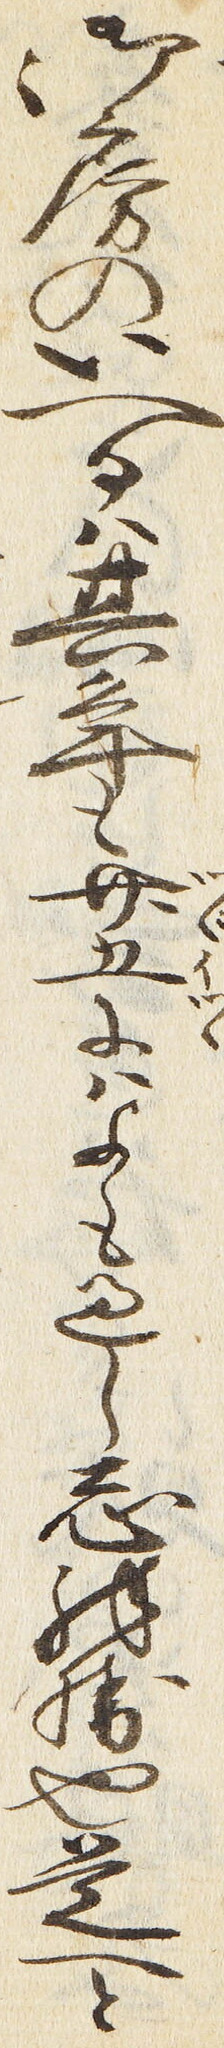御房のいへるは其年も廿五にはよも過し志殊勝也是へと
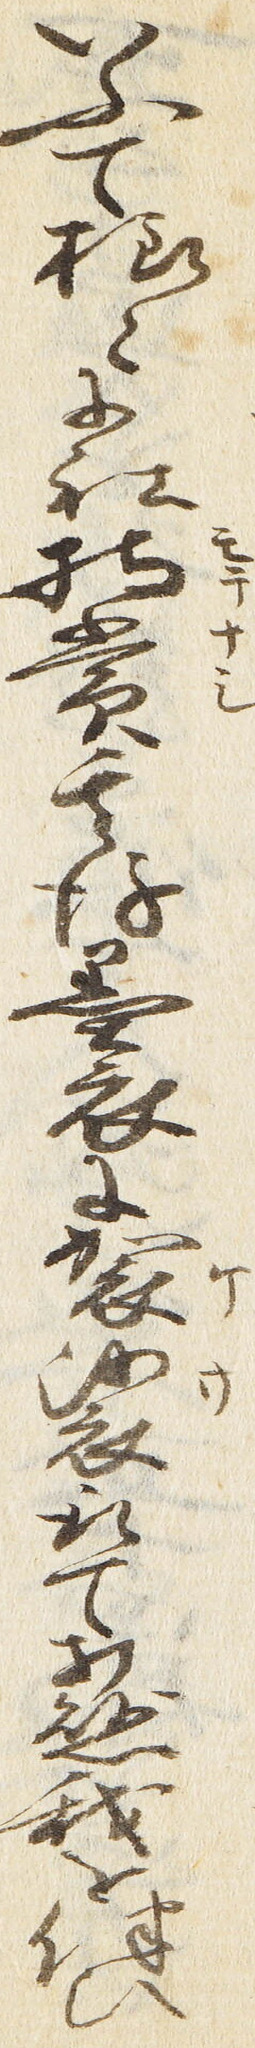いふて様々に社持賞其後墨衣に袈裟取て打懸我を伴ひ
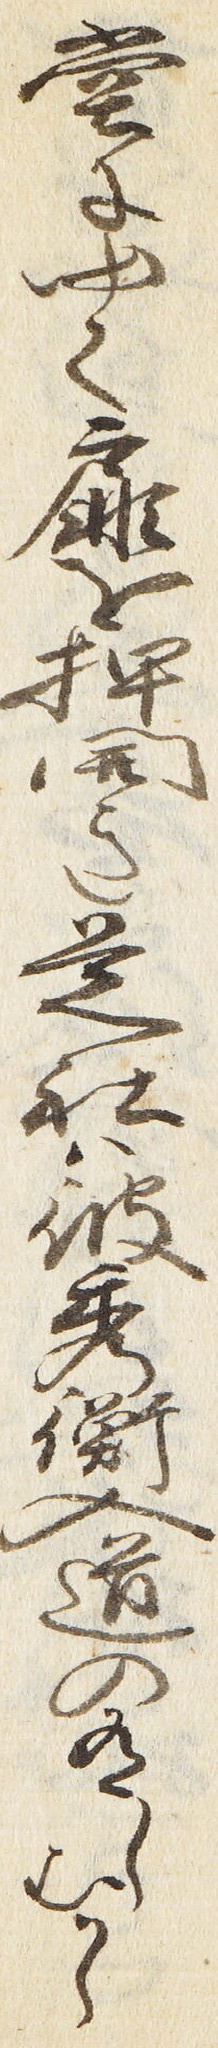堂にゆく扉を押開き是社は彼秀衡入道の有しむかし
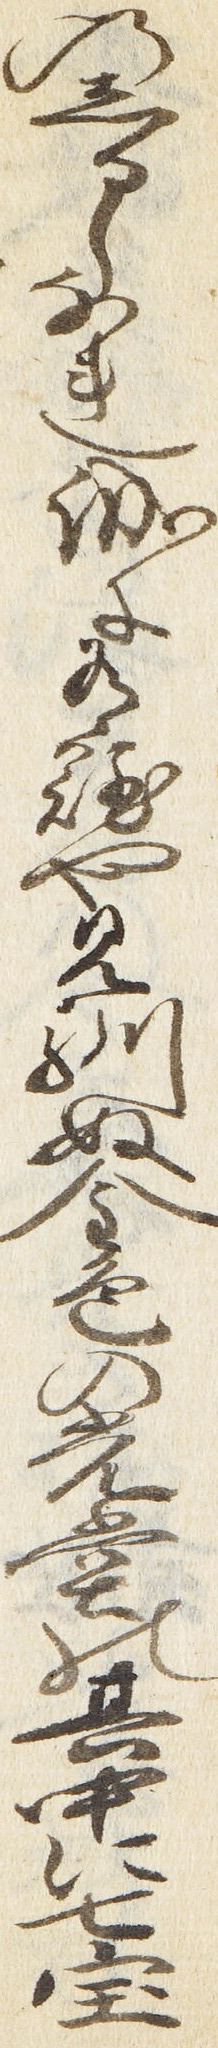のしるしなれ誠に有難や見馴ぬ金色の光堂の其中に七宝
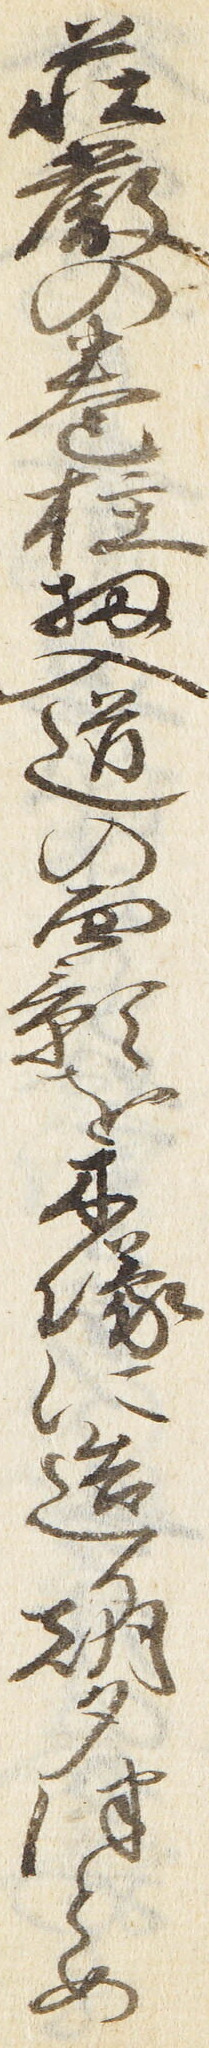荘厳の巻柱扨入道の面影を木像に造り朝夕つとめ
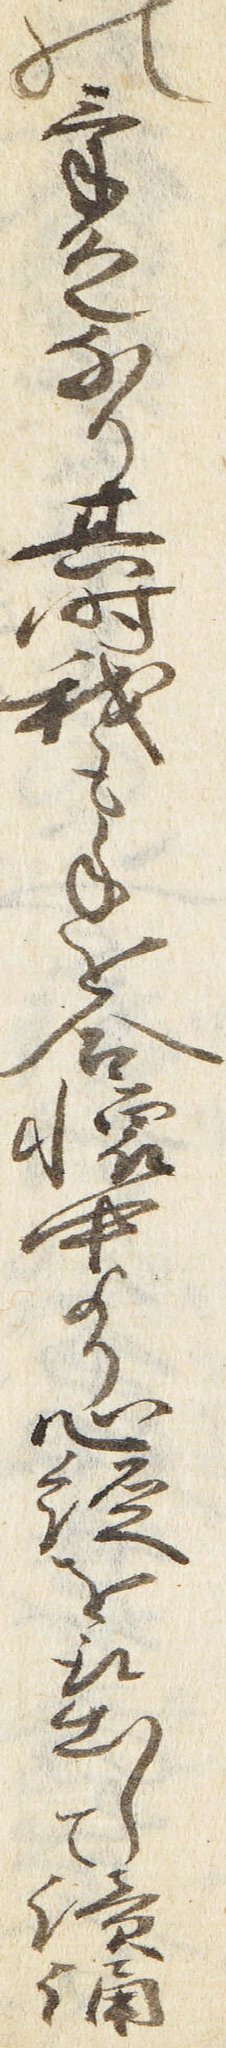の気色なり其時我も手を合懐中より心経を取出して読誦
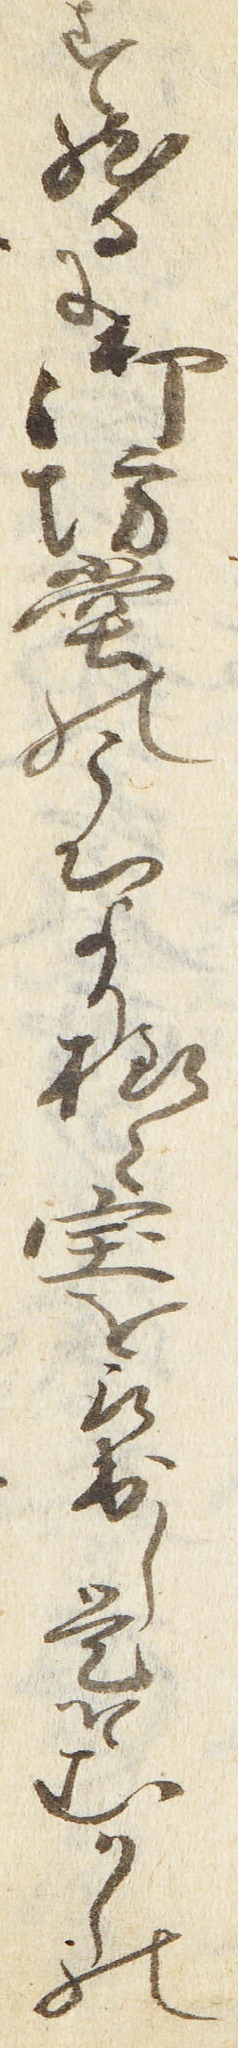す然るに御坊堂のうちより様々宝を取出し是そむかしの
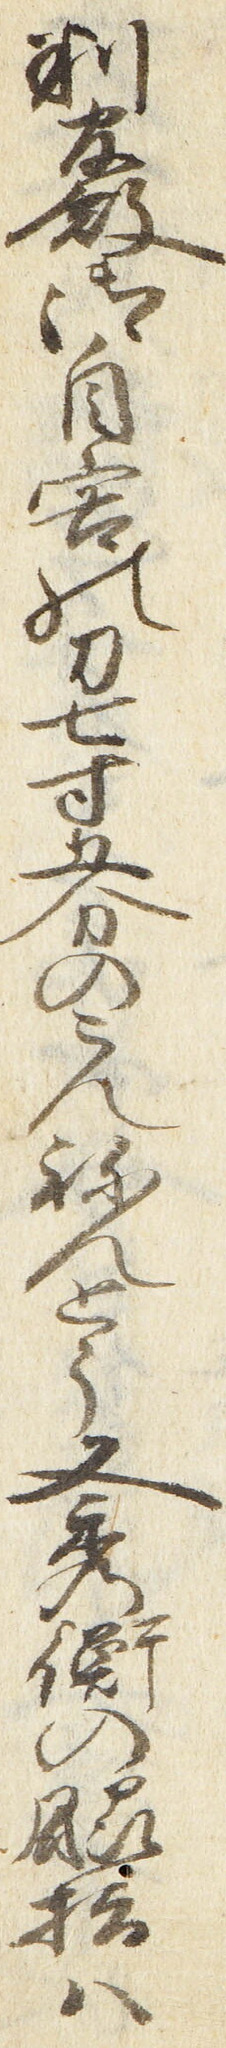判官殿御自害の刀七寸五分のこんねんとう又秀衡の脇指は
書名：海陸世話日記
